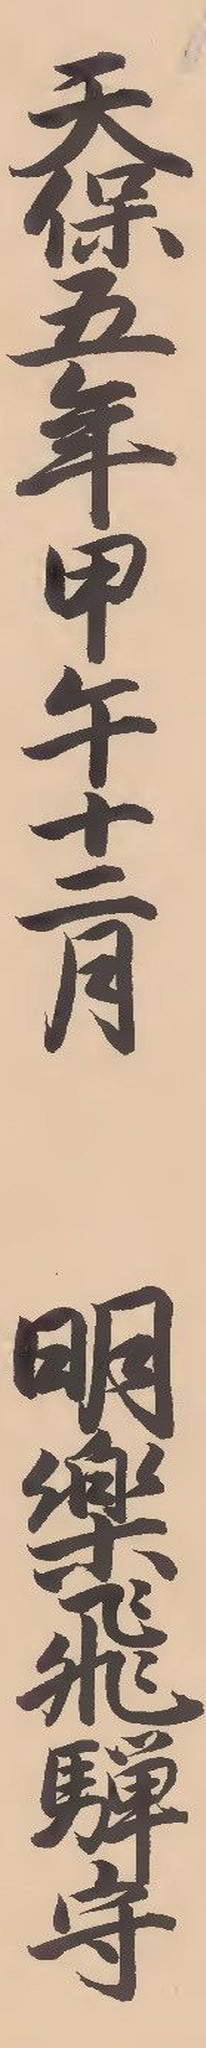天保五年甲午十二月明楽飛騨守
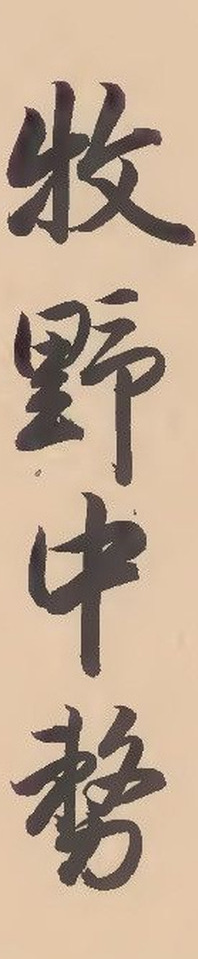牧野中務
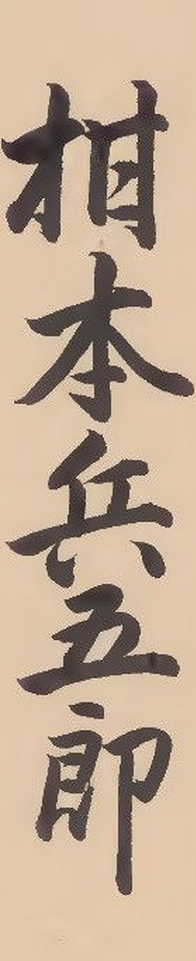柑本兵五郎
